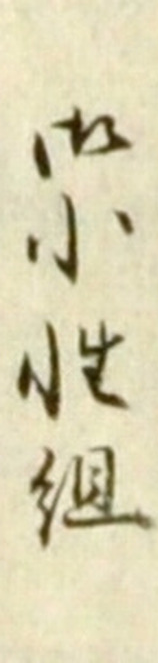御小姓組
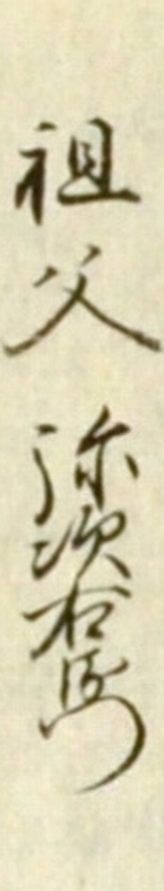祖父弥次右衛門
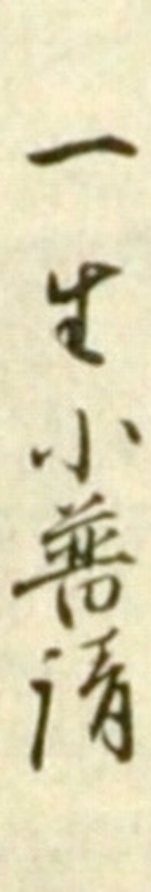一生小普請
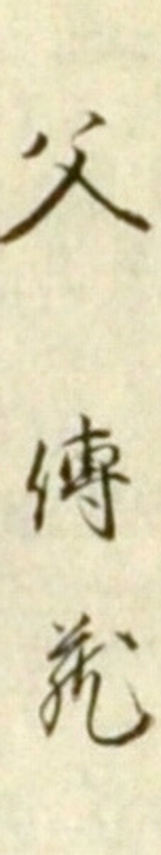父傳蔵
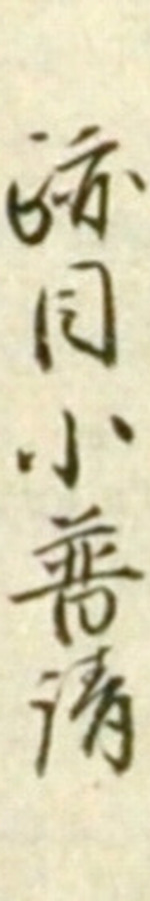跡目小普請
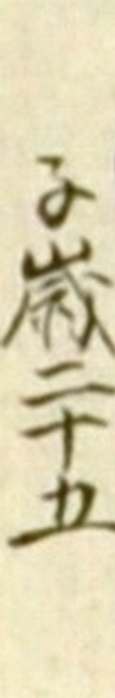子歳二十五
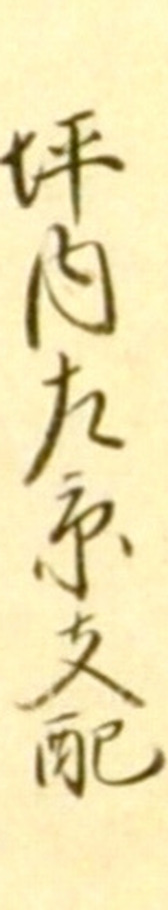坪内左京支配
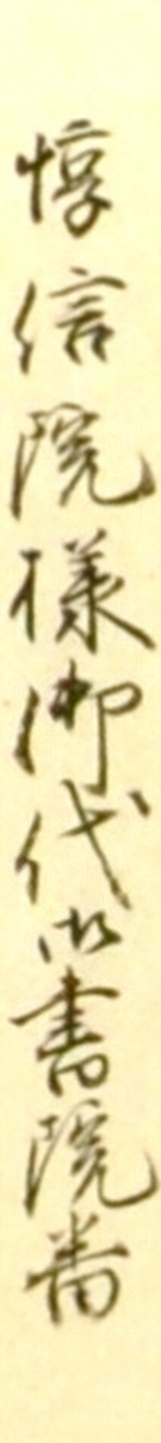惇信院様御代御書院番
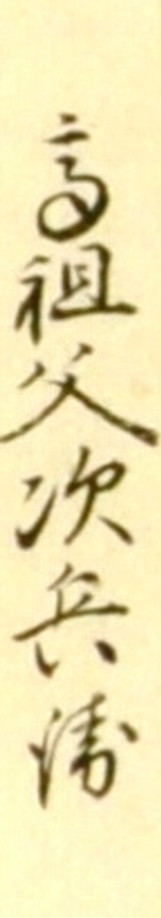高祖父次兵衛
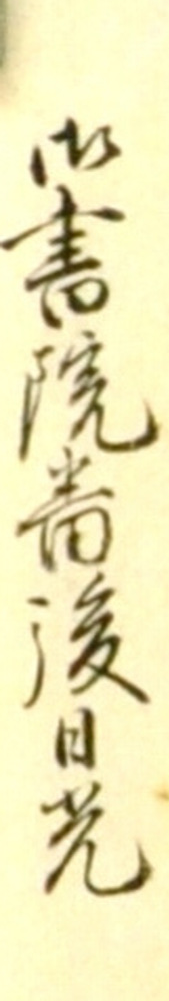御書院番後日光

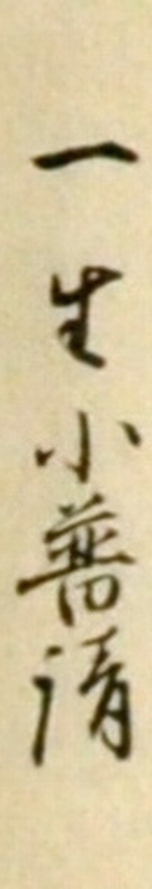一生小普請
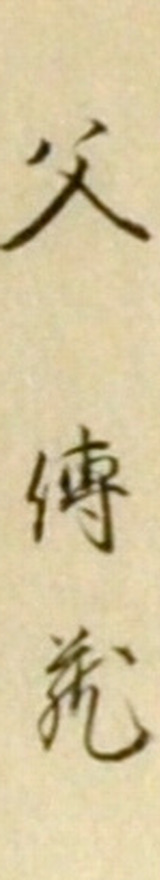父傳蔵
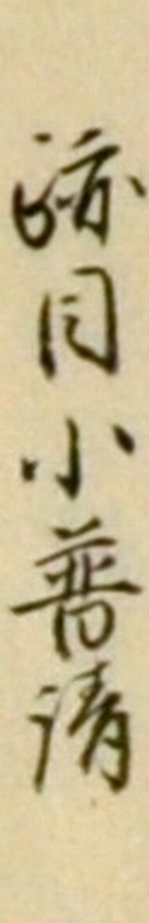跡目小普請
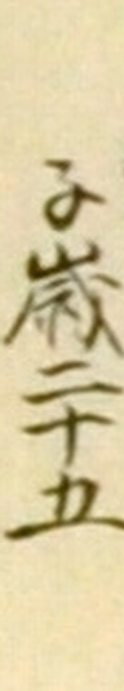子歳二十五
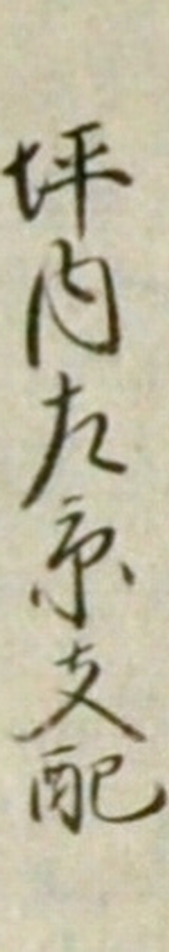坪内左京支配
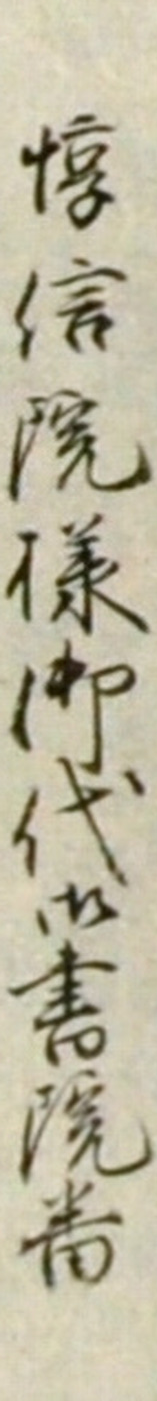惇信院様御代御書院番
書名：若年寄御役中御調書付
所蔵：伊那市立高遠町図書館・合同会社AMANE
